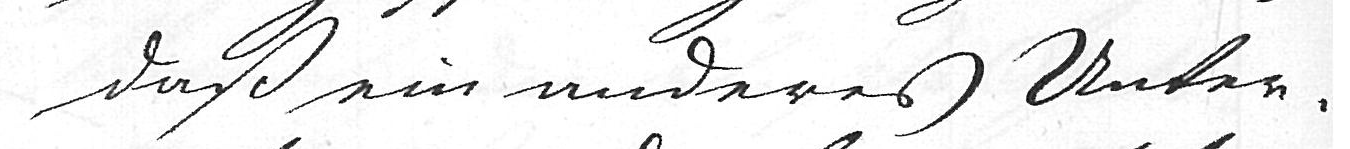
daß ein anderes Unter-
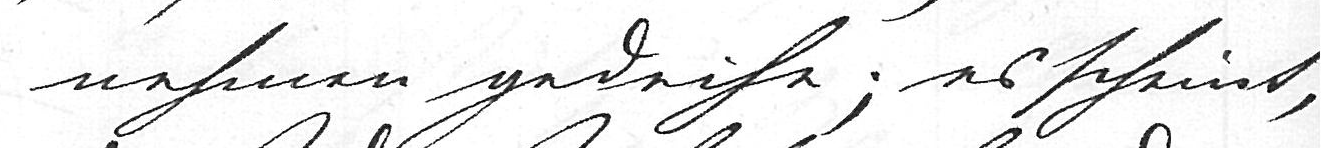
nehmen gedeihe; es scheint
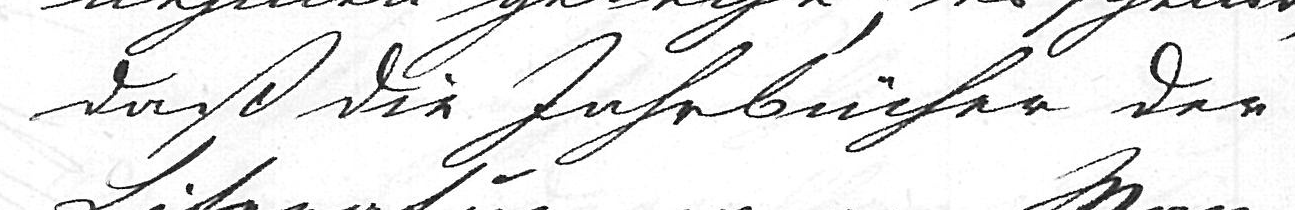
daß die Jahrbücher der
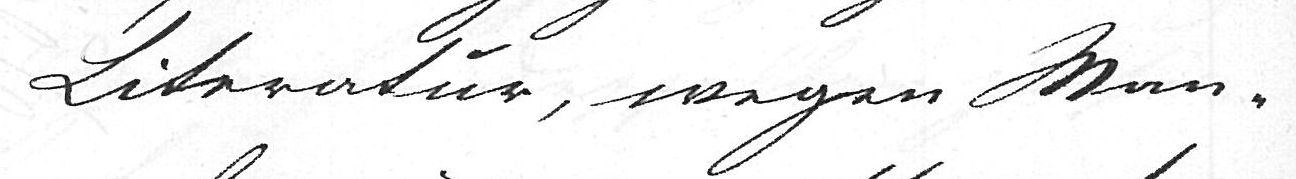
Literatur, wegen Man-
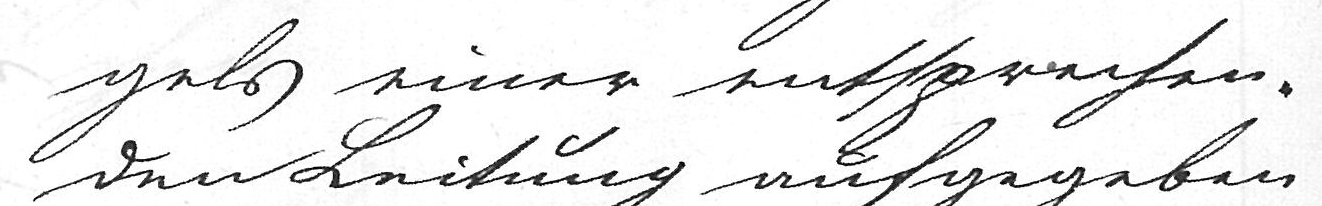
gels einer entsprechen-
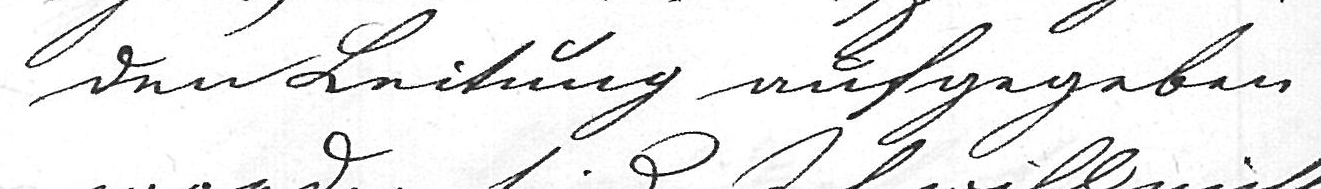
den Leitung aufgegeben
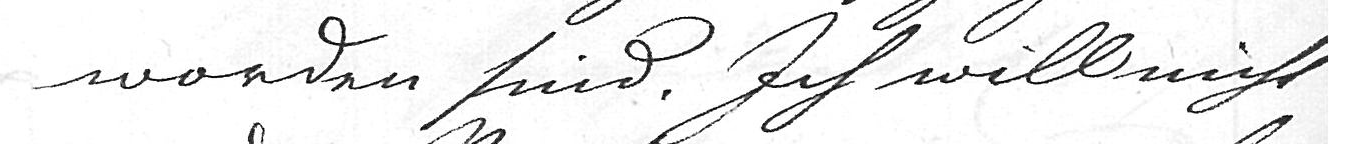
worden sind. Ich will nicht
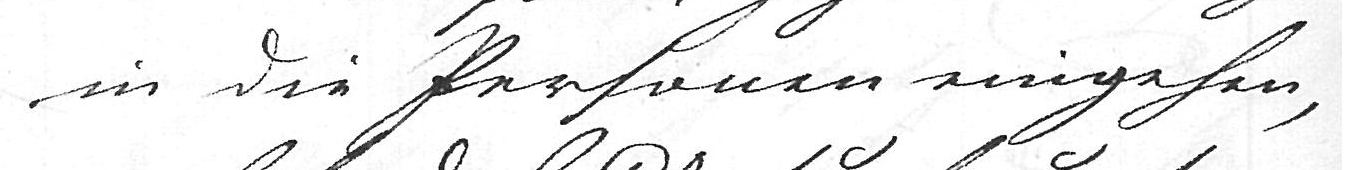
in die Personen eingehen,
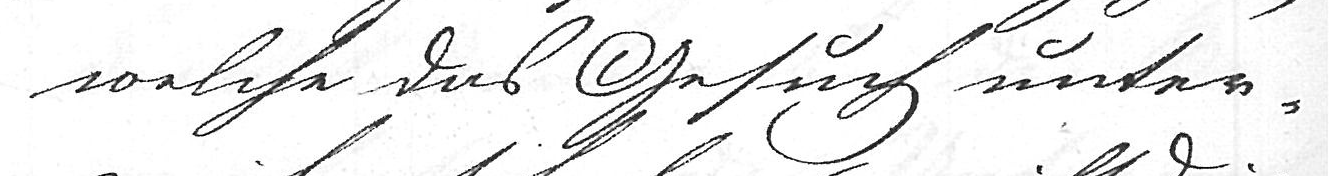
welche das Gesuch unter
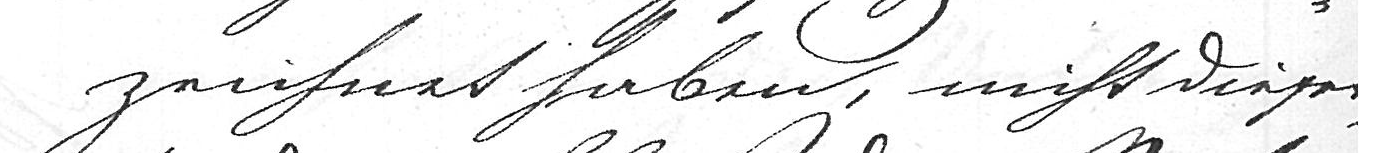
zeichnet haben, nicht dieser,
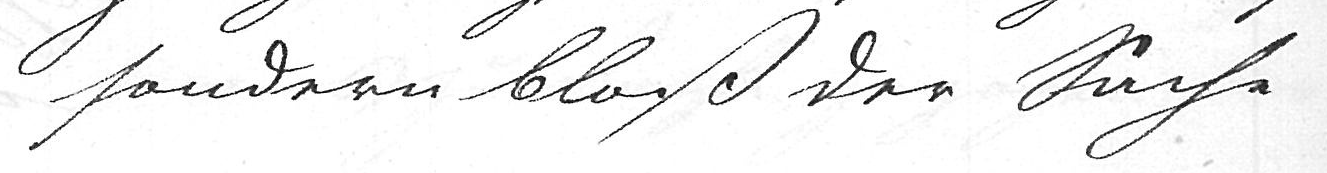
sondern bloß der Sache
